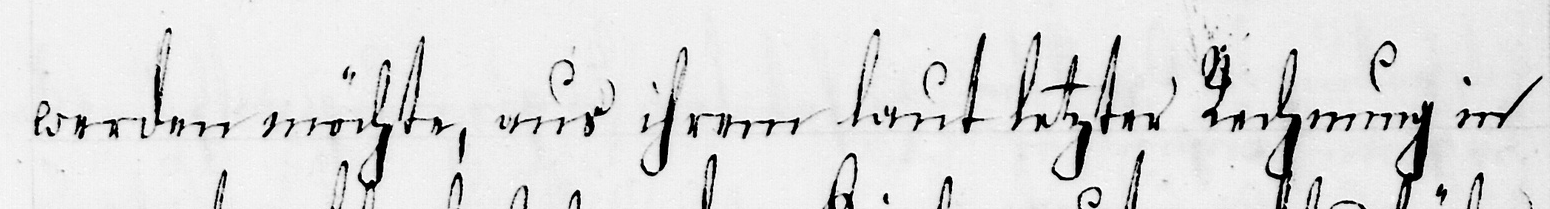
werden möchte, aus ihrem laut letzter Rechnung in
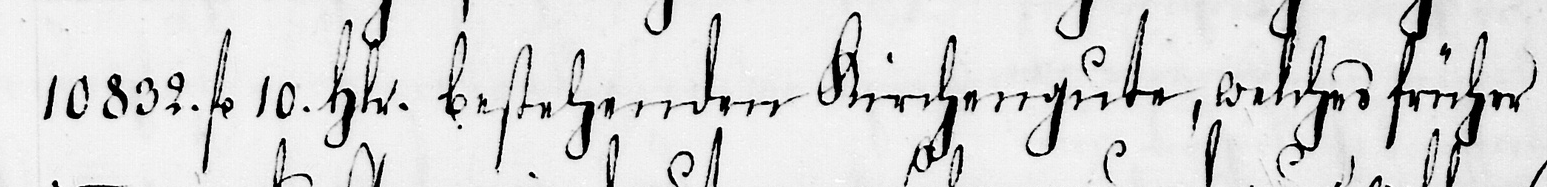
10 832. fl. 10. Hlr. bestehenden Kirchengute, welches früher
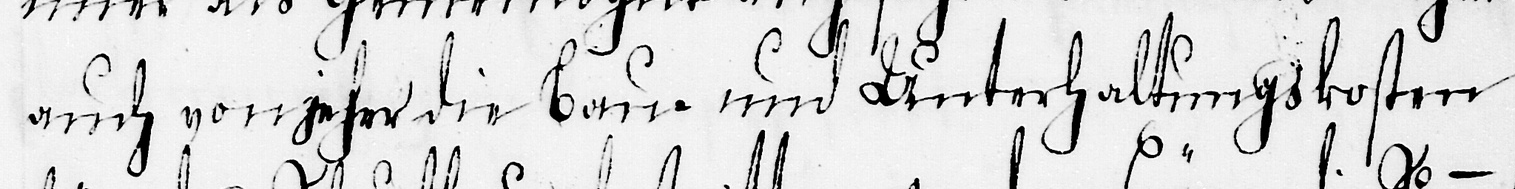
auch von jeher die Bau- und Unterhaltungskosten
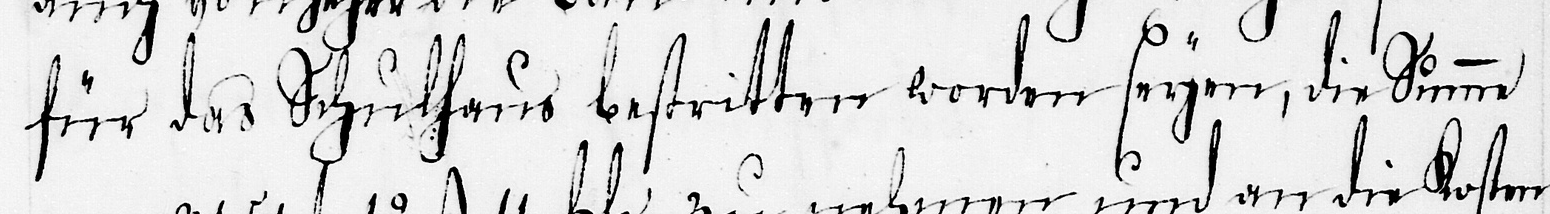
für das Schulhaus bestritten worden seyen, die Summe
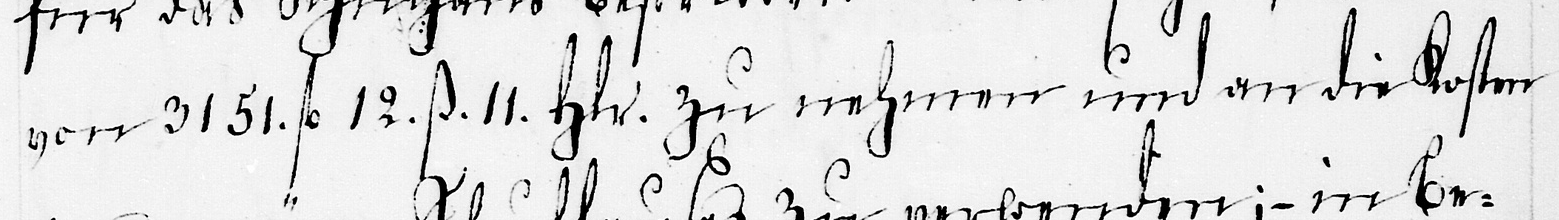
von 3151. fl. 12. ß. 11. Hlr. zu nehmen und an die Kosten
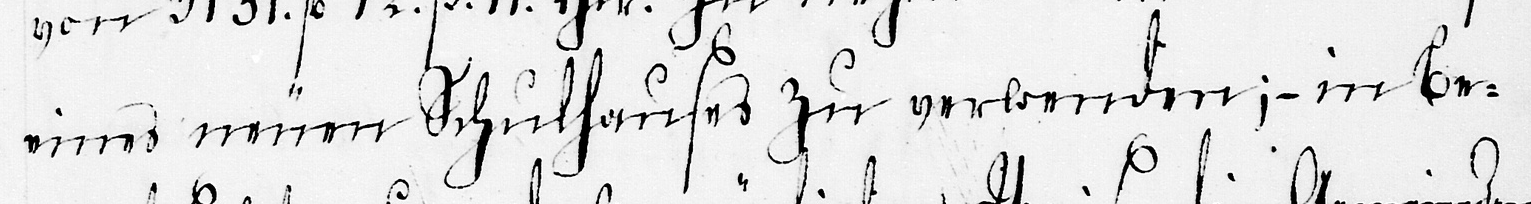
eines neuen Schulhauses zu verwenden; – in Be¬
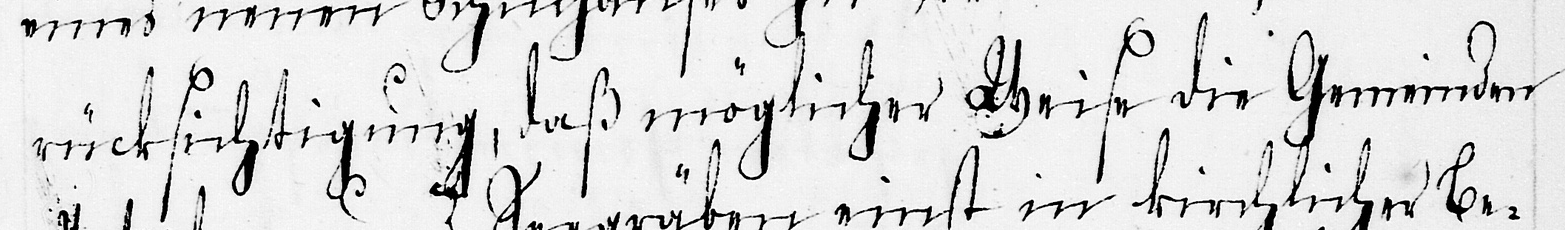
rücksichtigung, daß möglicher Weise die Gemeinden
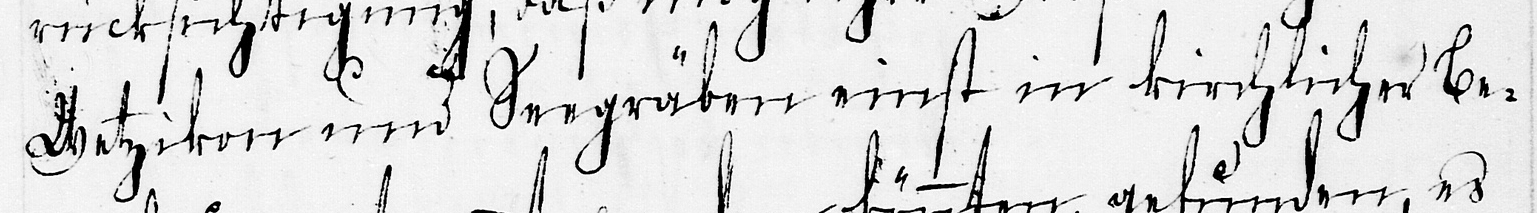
Wetzikon und Seegräben einst in kirchlicher Be¬
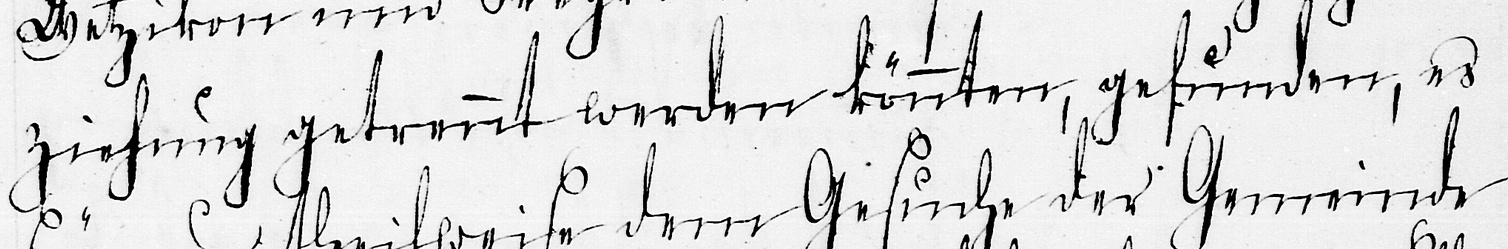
ziehung getrennt werden könnten, gefunden, es
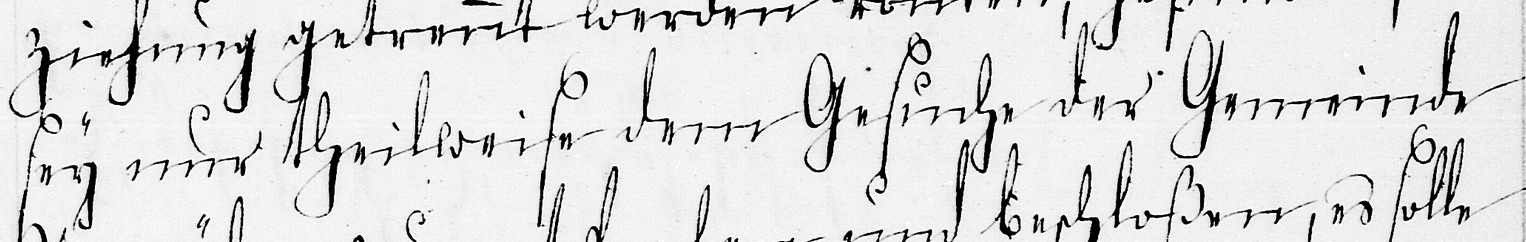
sey nur theilweise dem Gesuche der Gemeinde
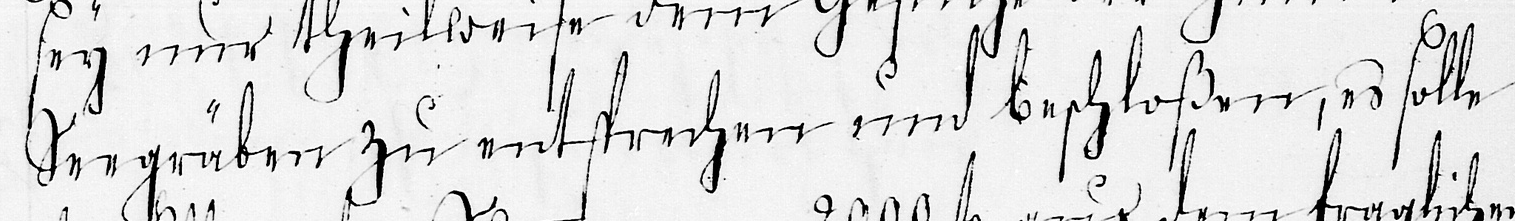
Seegräben zu entsprechen und beschloßen, es solle
